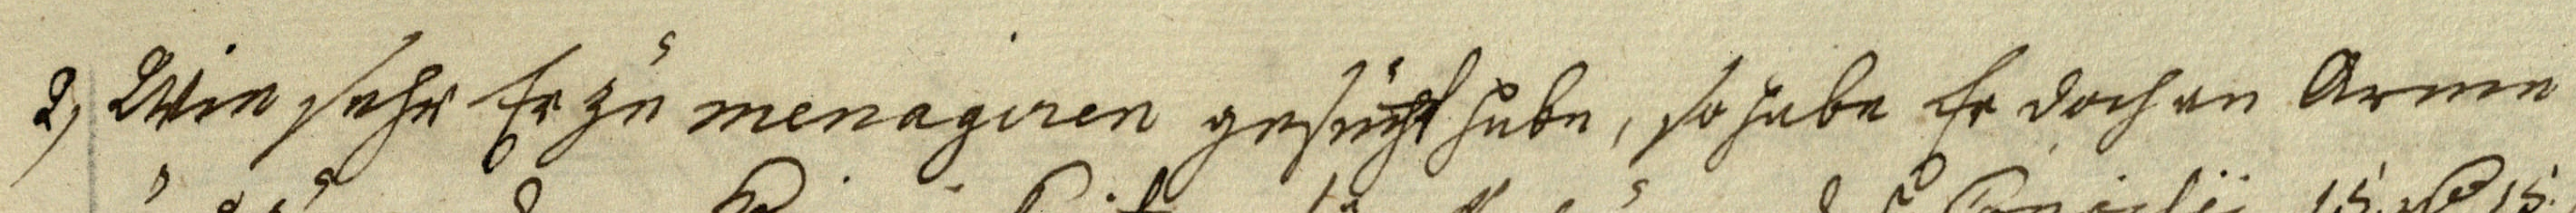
2, Wie sehr Er zu menagiren gesucht habe, so habe Er doch an Arme
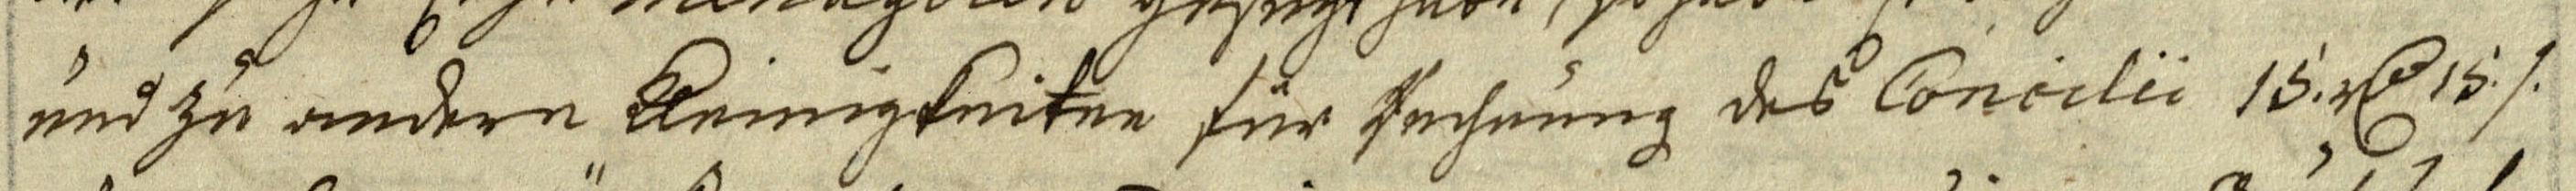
und zu andern Kleinigkeiten für Rechnung des Concilii 15 rl. 15 s.
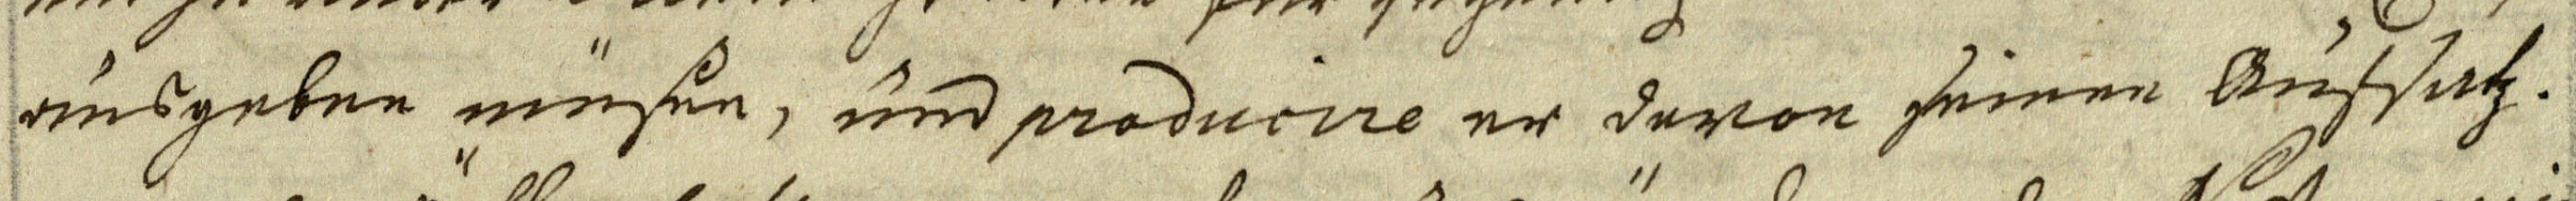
ausgeben müßen, und producire er davon seinen Aufsatz.
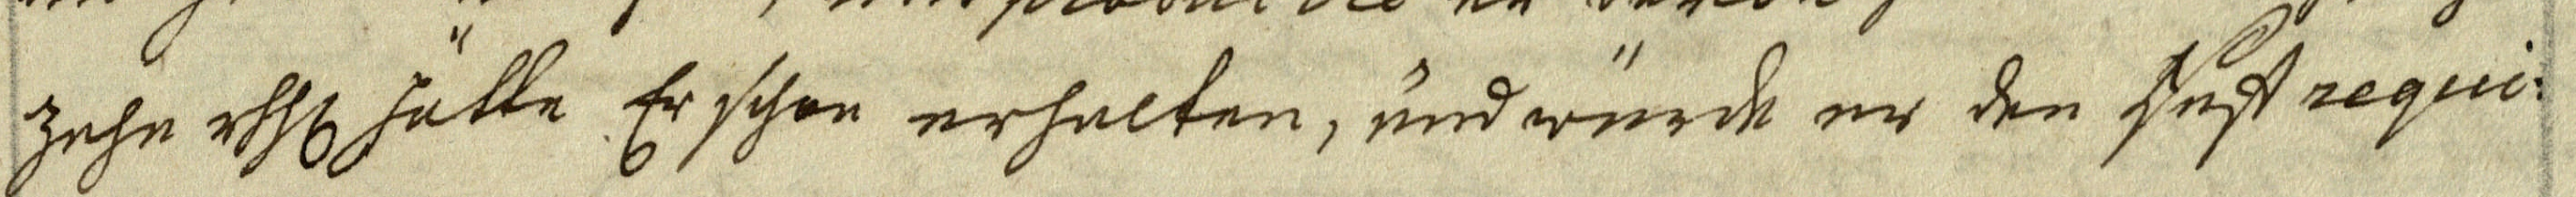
Zehn rl. hätte Er schon erhalten, und würde er den Rest requi¬
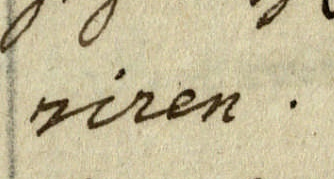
riren.
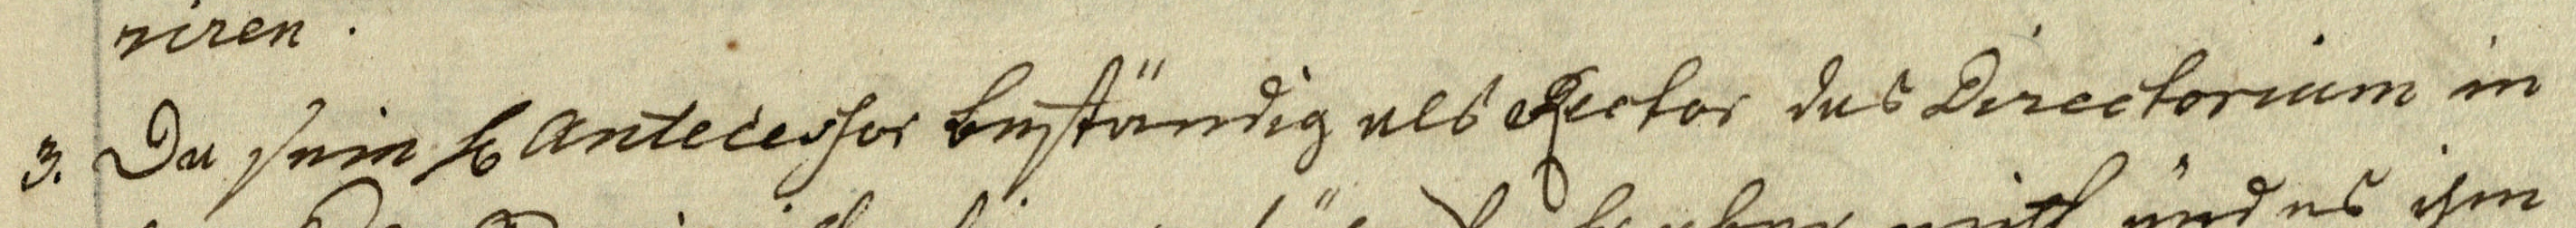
3. Da sein h. Antecessor beständig als Rector das Directorium in
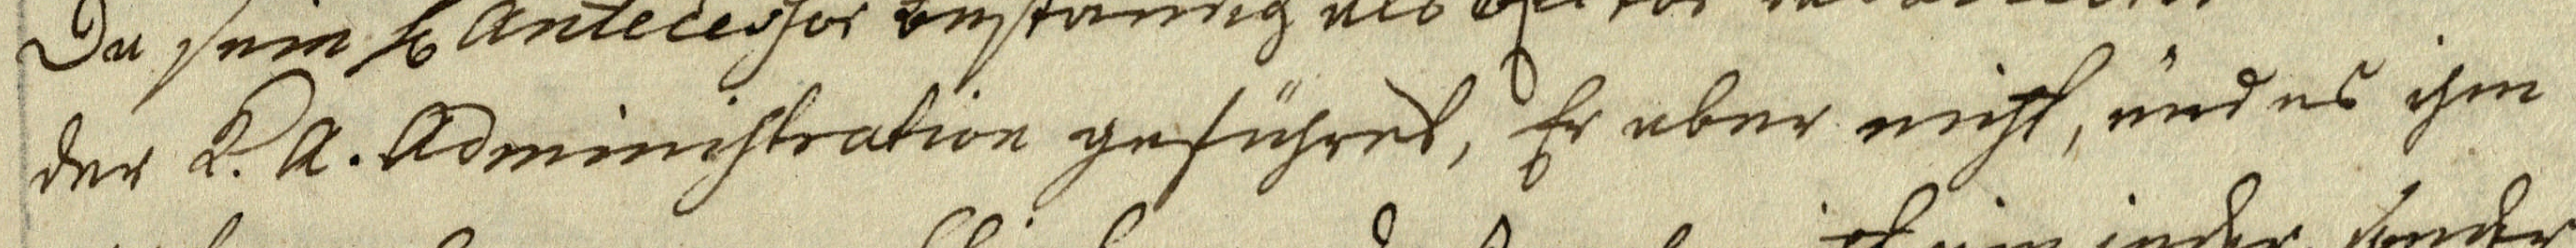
der K. A. Administration geführet, Er aber nicht, und es ihm
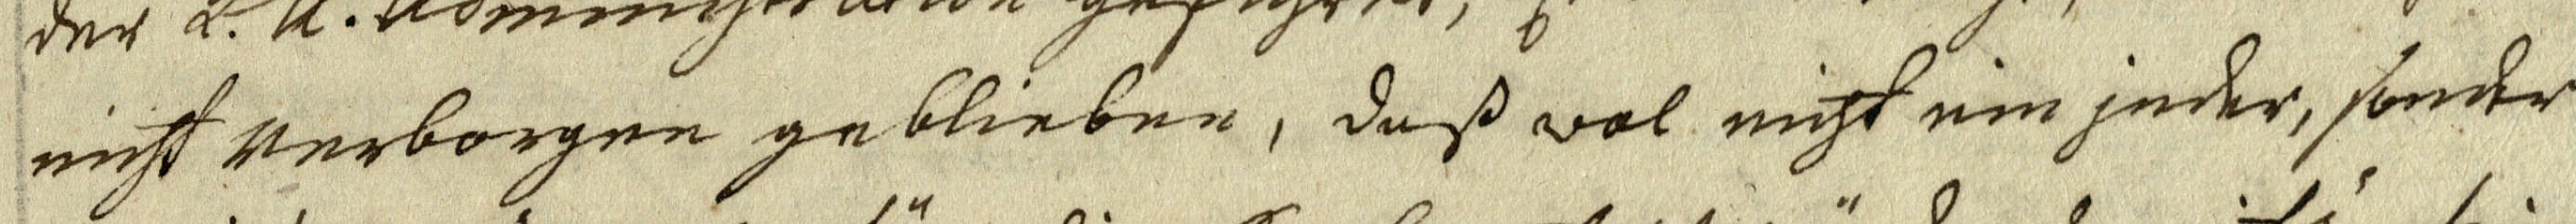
nicht verborgen geblieben, daß wol nicht ein jeder, sonder
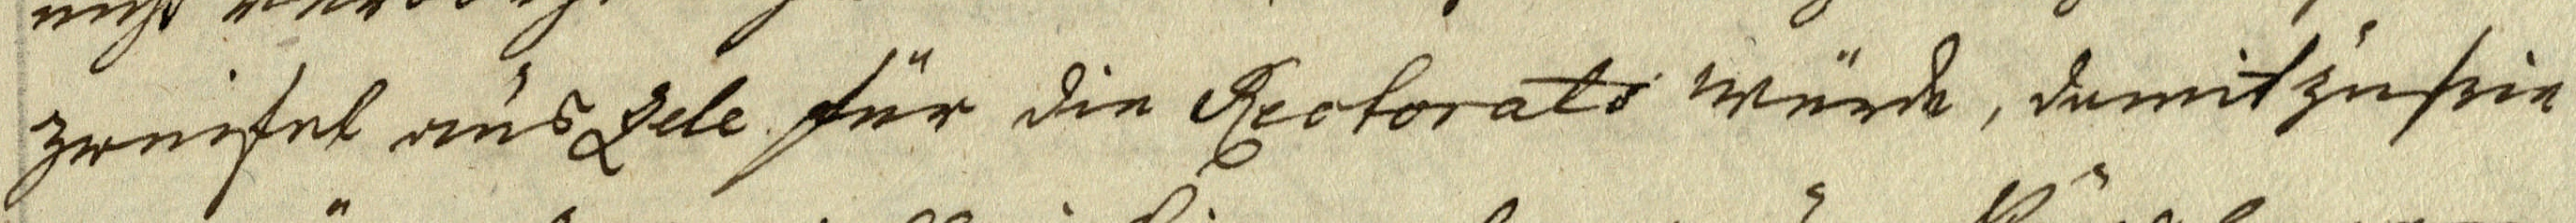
Zweifel aus zele für die Rectorats Würde, damit zufrie¬
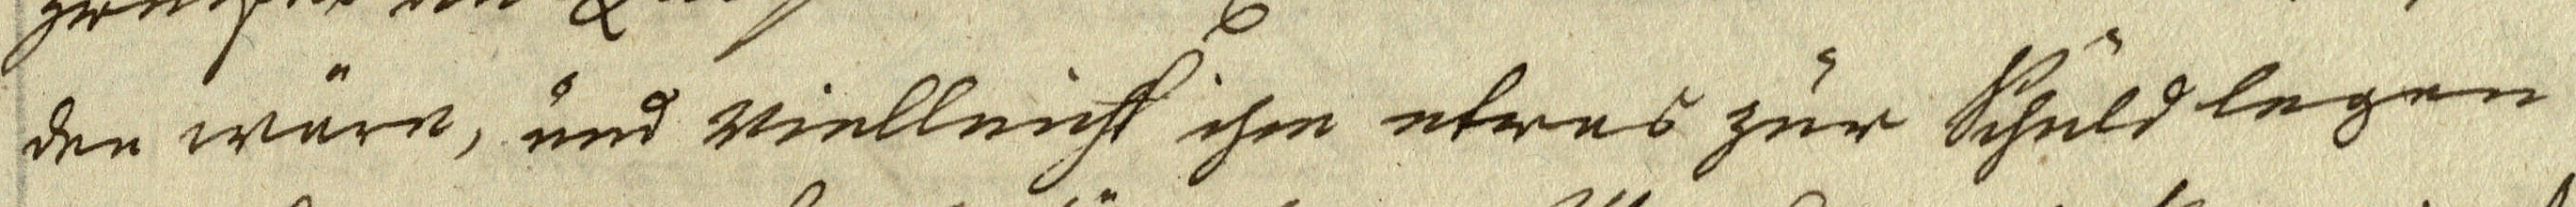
den wäre, und vielleicht ihm etwas zur Schuld legen
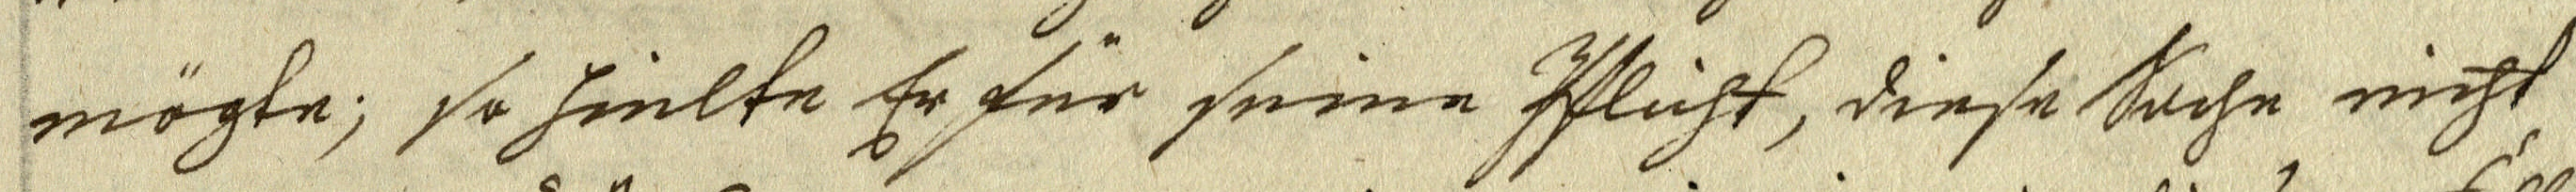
mögte; so hielte Er für seine Pflicht, diese Sache nicht
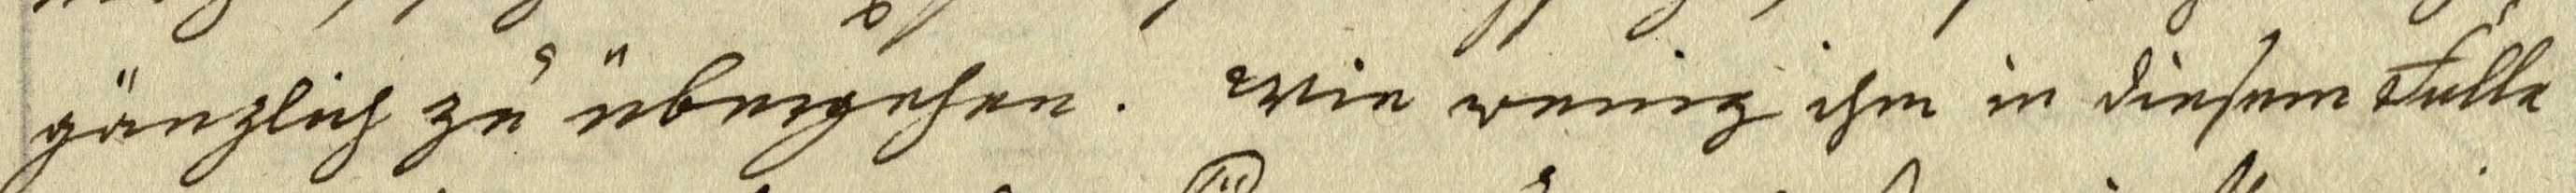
gänzlich zu übergehen. Wie wenig ihm in diesem Falle
